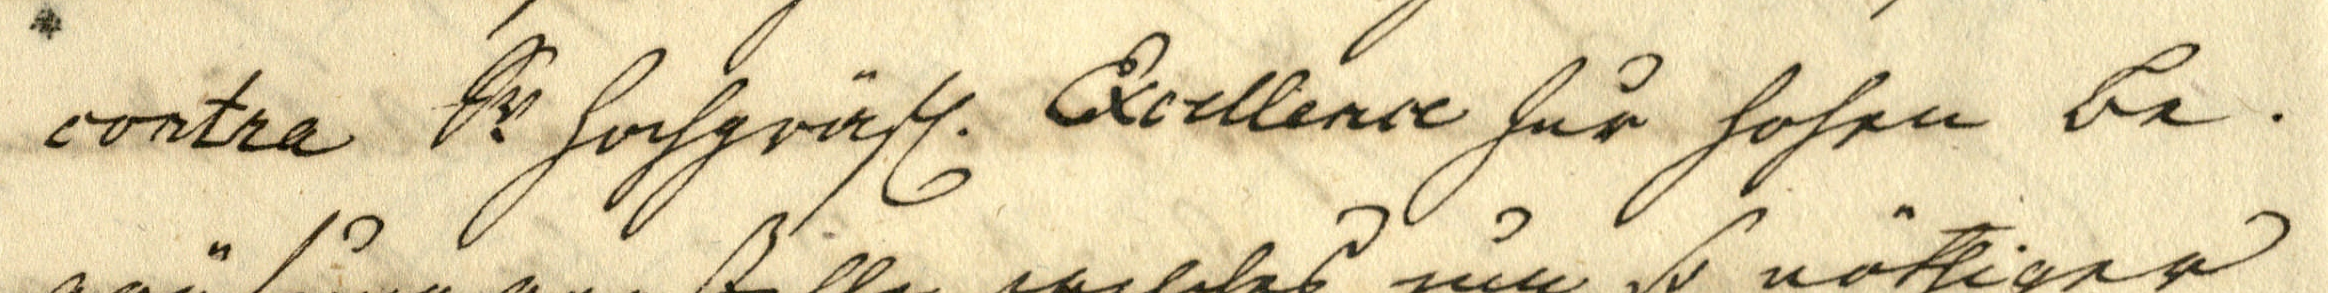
contra Sr. hochgräfl. Excellence zur hohen Be-
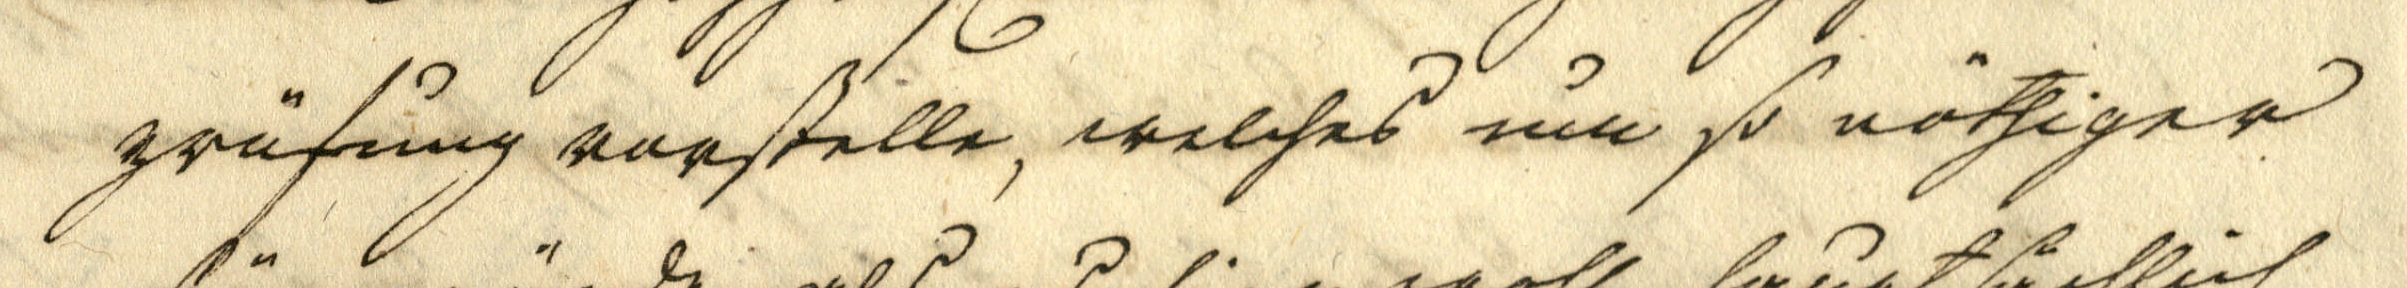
prüfung vorstelle, welches um so nothiger
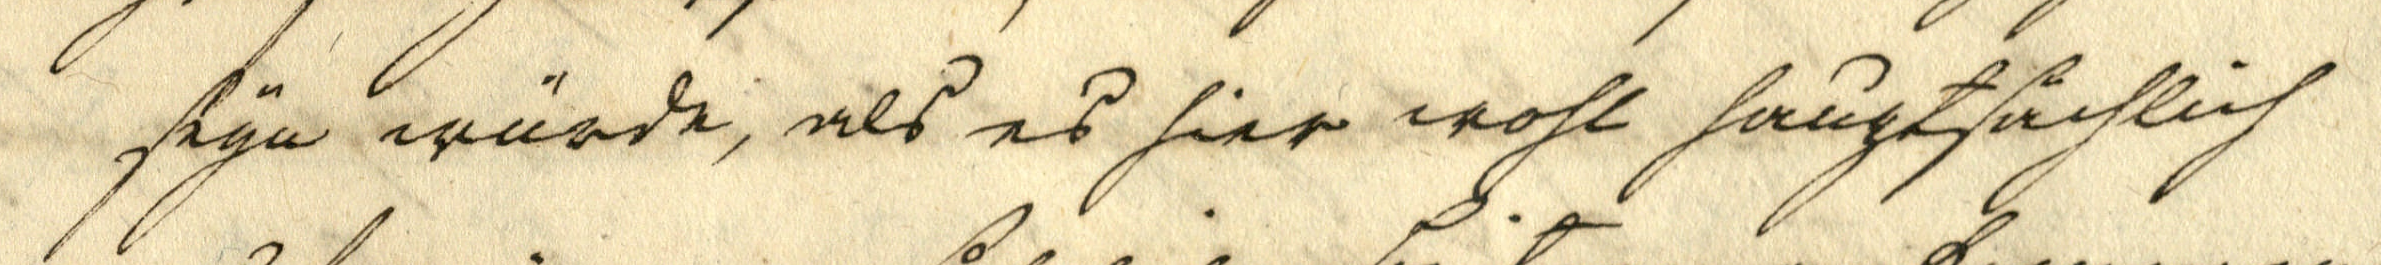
seyn würde, als es hier wohl hauptsächlich
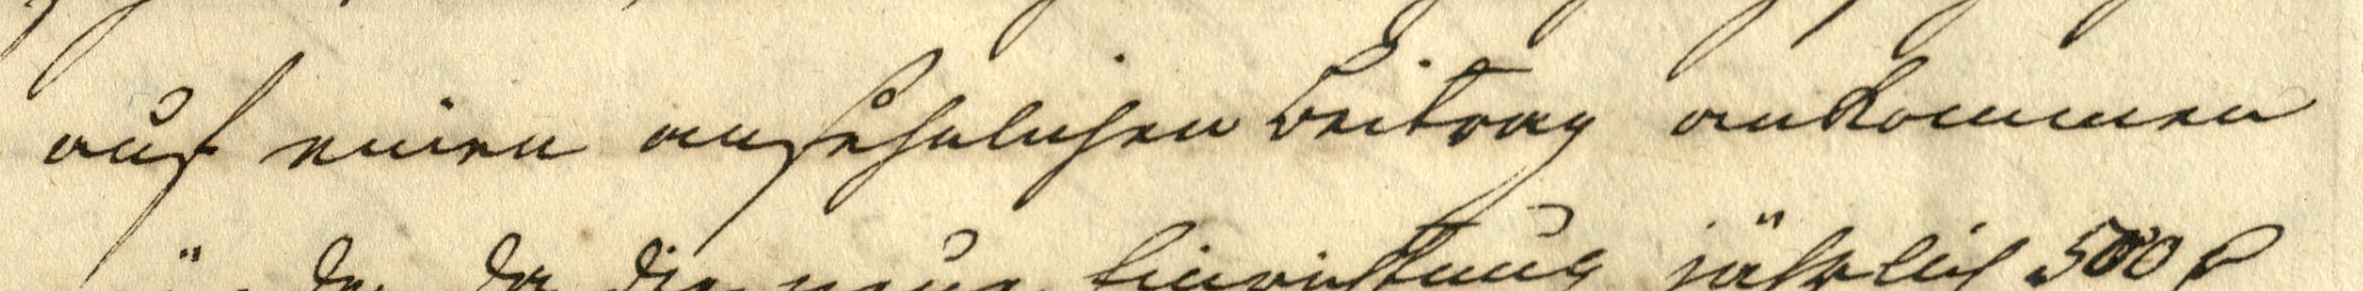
auf einen ansehnlichen Beitrag ankommen
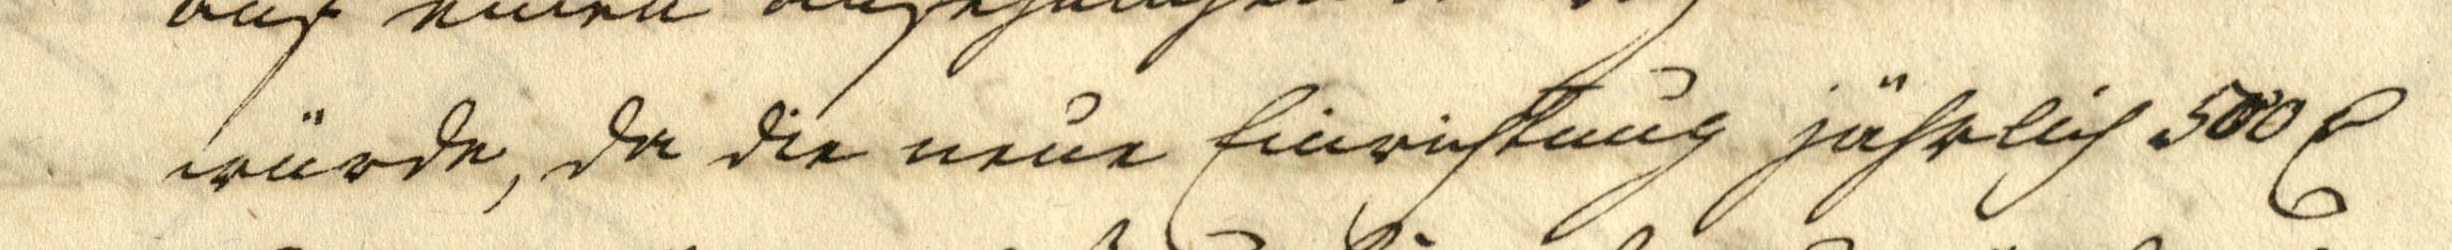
würde, da die neue Einrichtung jährlich 500 rtl
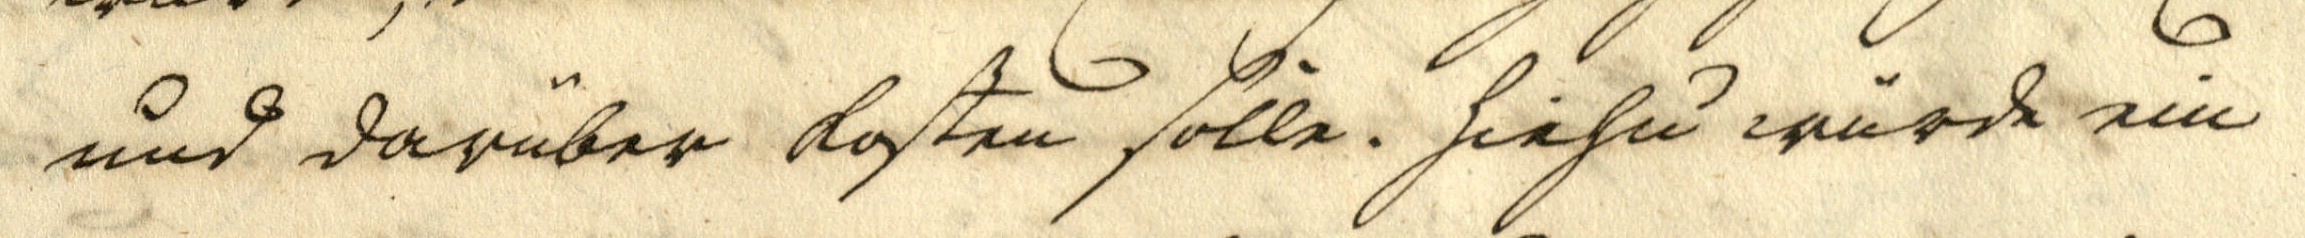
und darüber kosten solle. Hiezu würde ein
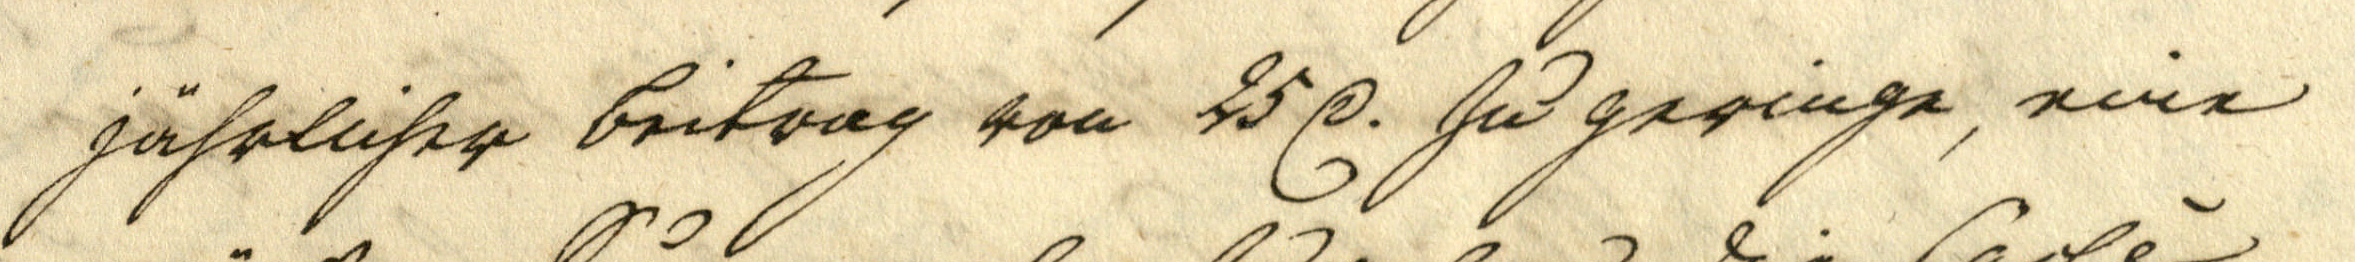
jährlicher Beitrag von 25 rt. zu geringe, eine
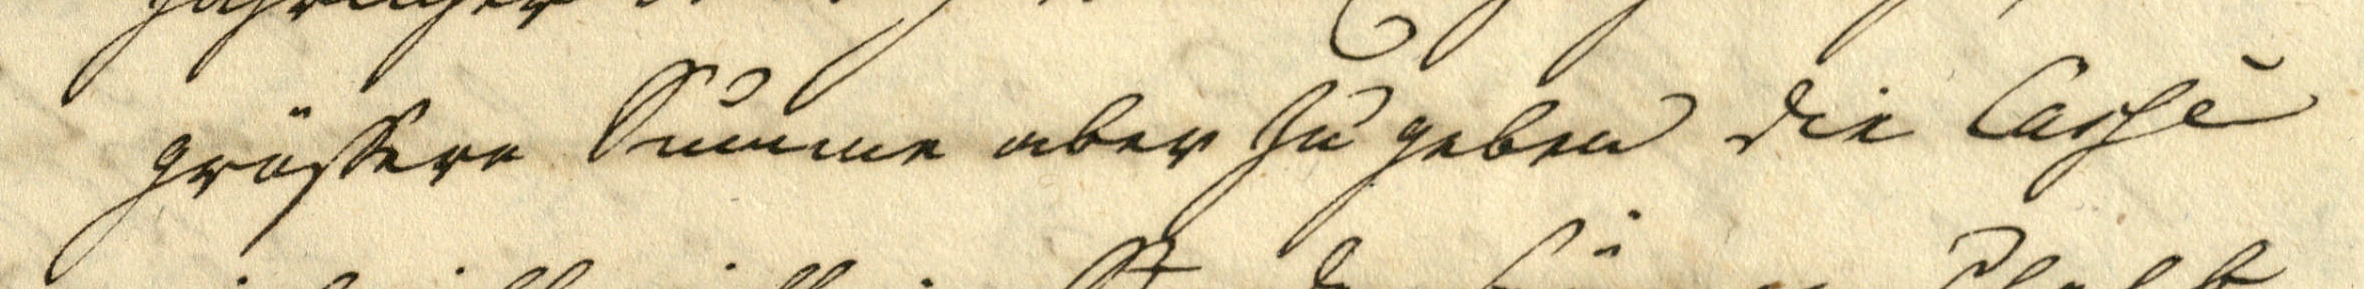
grössere Summe aber zu geben die Casse
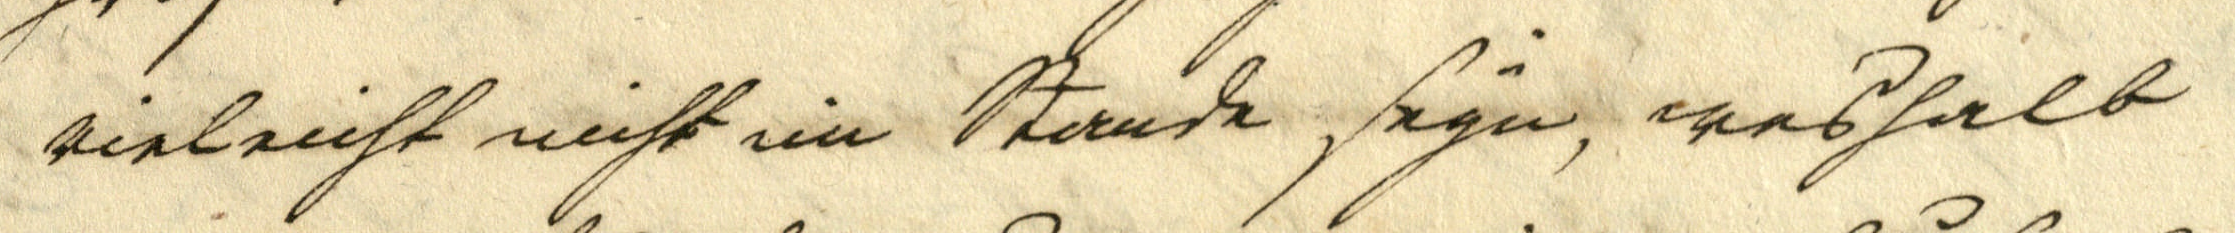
vielleicht nicht im Stande seyn, weshalb
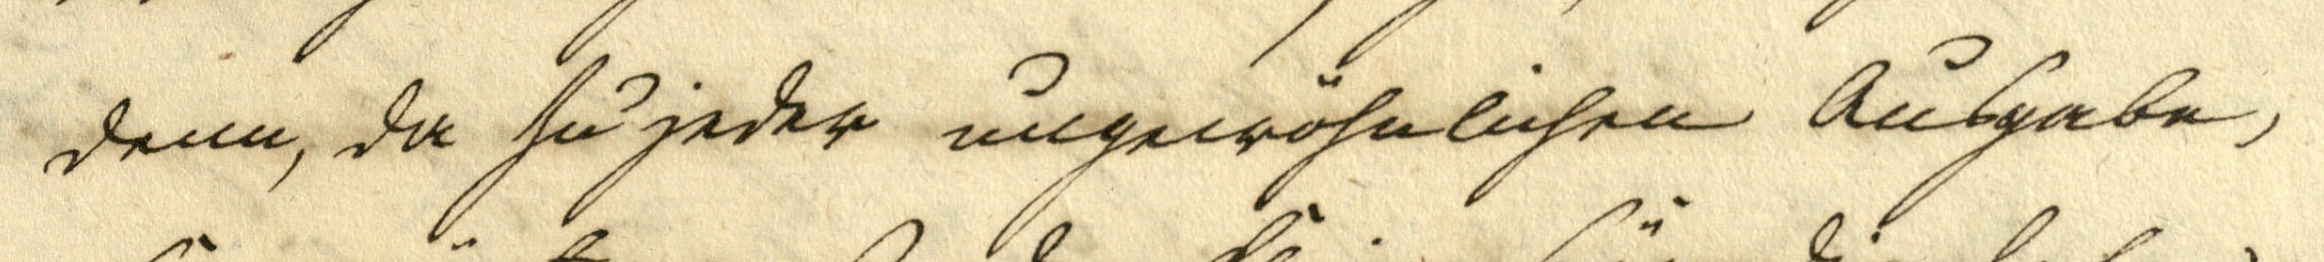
denn, da zu jeder ungewöhnlichen Ausgabe,
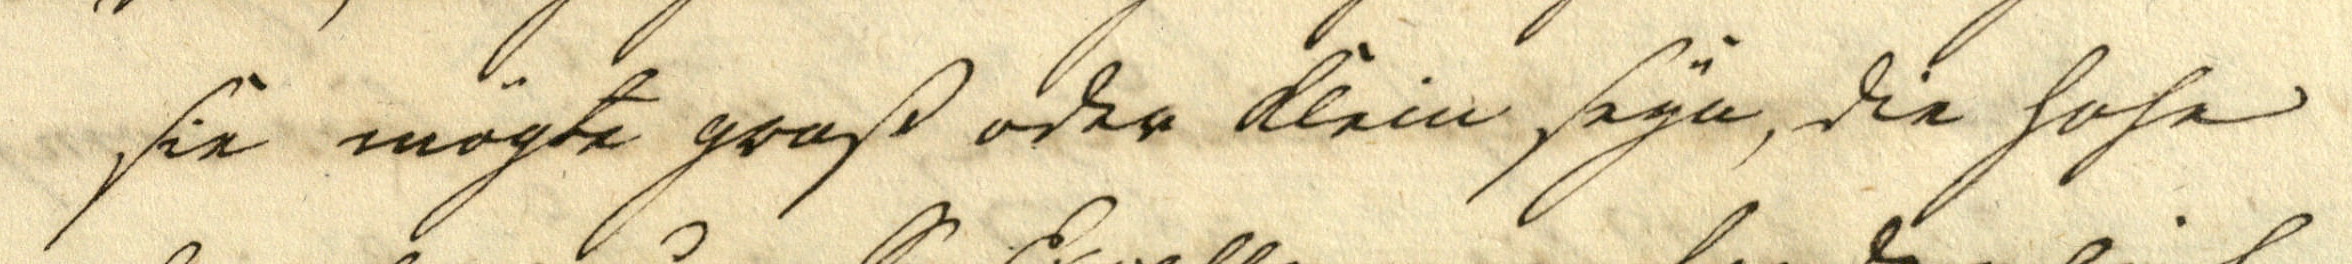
sie mögte groß oder klein seyn, die hohe
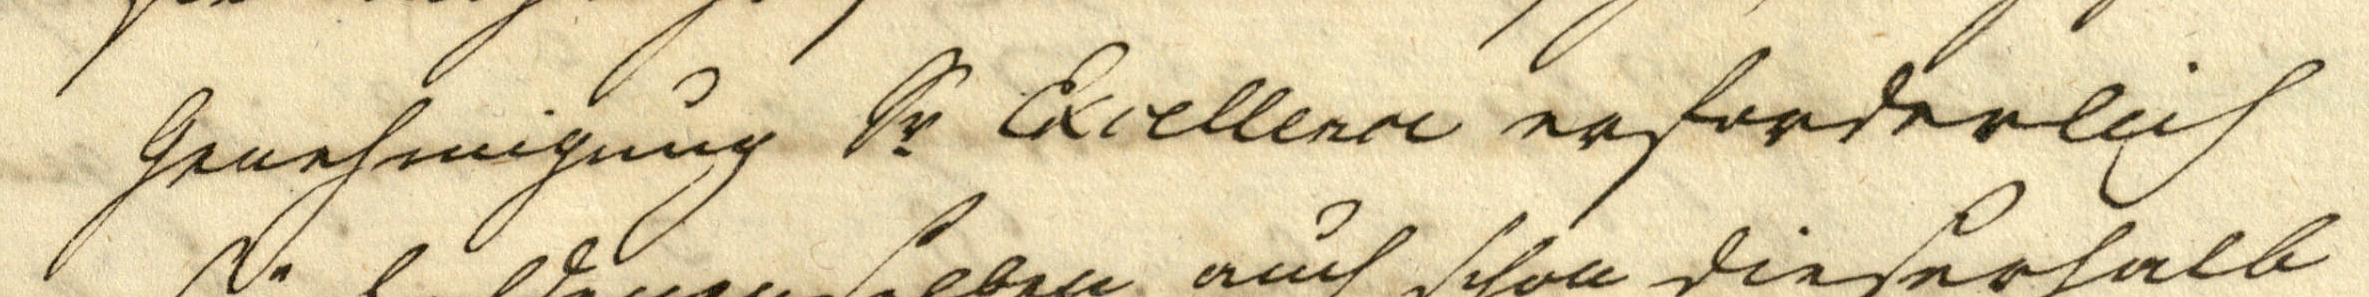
Genehmigung Sr. Excellence erforderlich
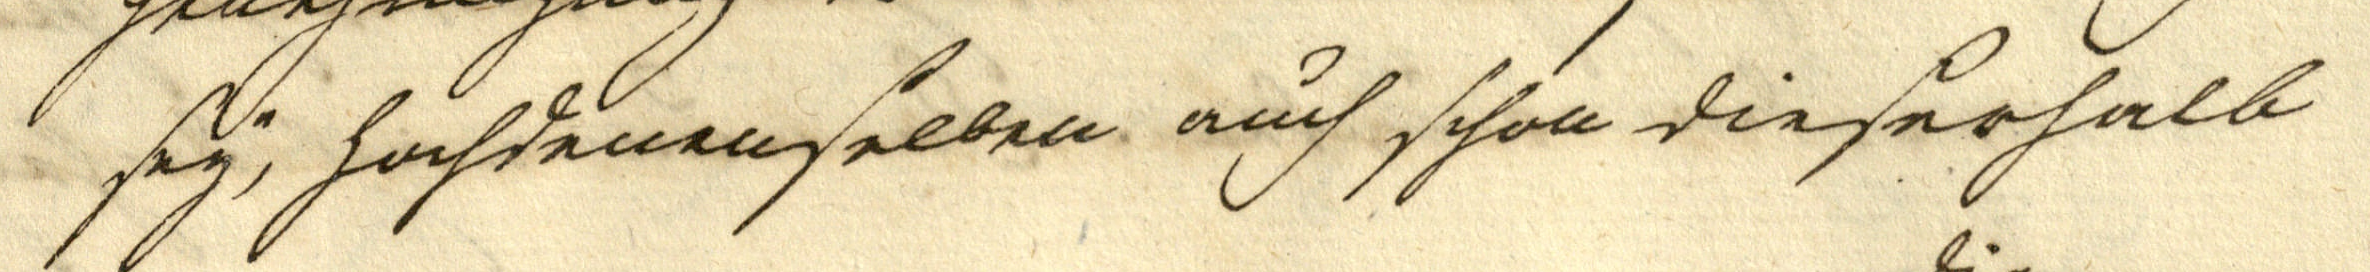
sey, hochdenenselben auch schon dieserhalb
